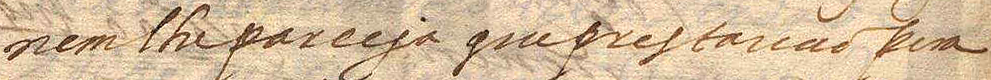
nem lhe parecja que prestauaõ pera
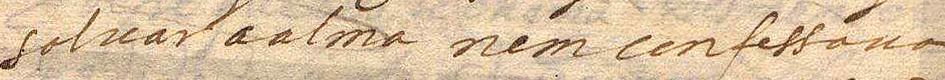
saluar a alma nem confessaua
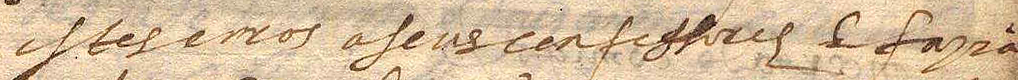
estes erros a seus confessores e fazia
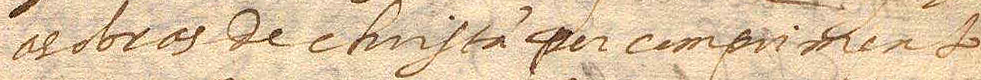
as obras de christã por comprimento
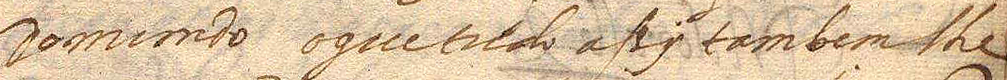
do mundo o que tudo assj tambem lhe
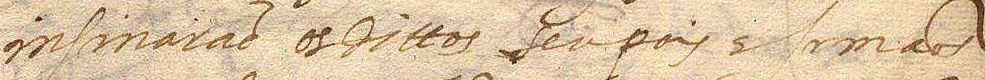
insinaraõ os dittos seu pay e Jrmaõs
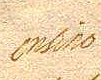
ensino
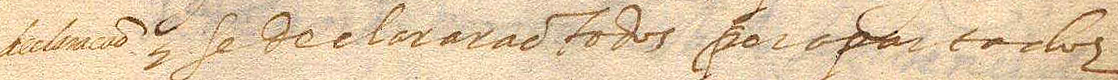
e se declararaõ todos por apartados
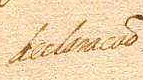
declaraçaõ
